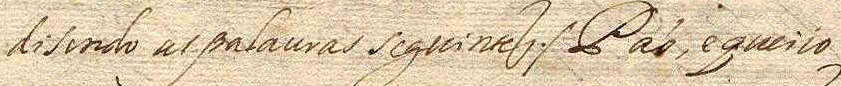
disendo as palavras seguintes. / Paõ, e queiio
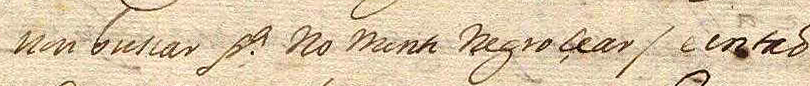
uou buscar p.a no monte negro çear / e entaõ
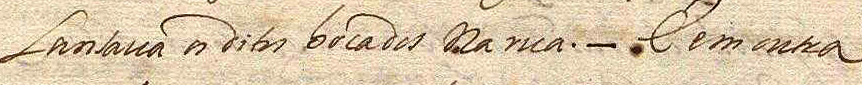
lansava os ditos bocados na rua. — E em outra
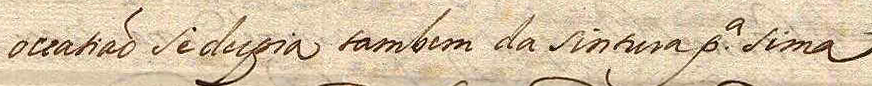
occasiaõ se despia tambem da sintura p.a sima
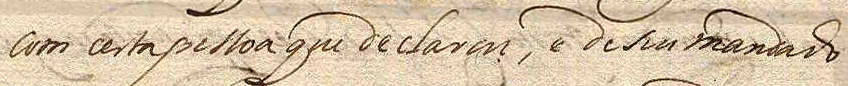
com certa pessoa que declarou, e de seu mandado
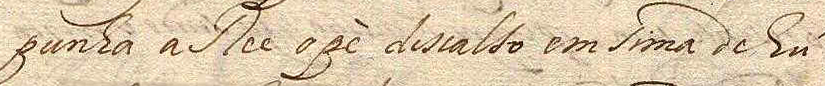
punha a Ree o pè descalso em sima de hū
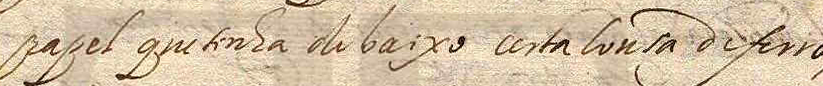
papel que tinha debaixo certa Cousa de ferro,
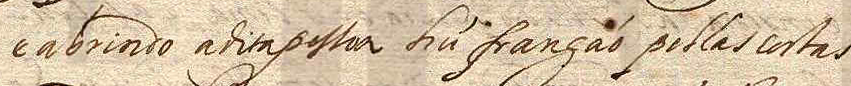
e abrindo a dita pessoa hū frangaõ pellas costas
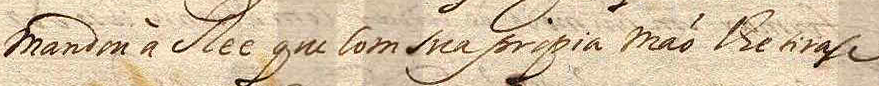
mandou à Ree que com sua propia maõ lhe tirase
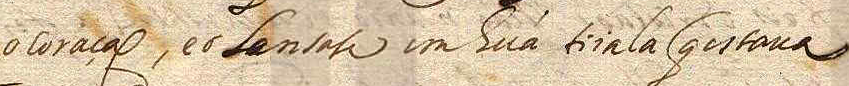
o coraçaõ, e o lansase em huā tiisela q̄ estaua
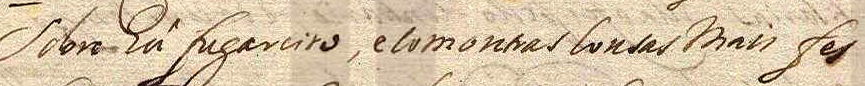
sobre hū fugareiro, e com outras cousas mais fes
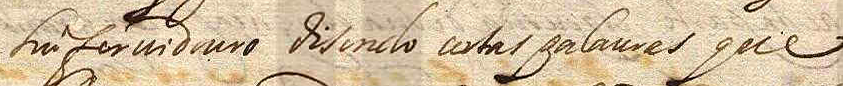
hū fervidouro disendo certas palauras que
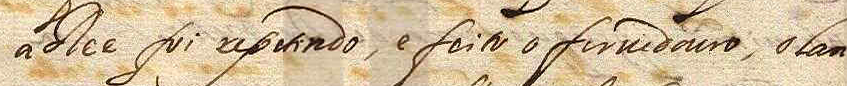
a Ree foi repetindo, e feito o feruedouro, o lan
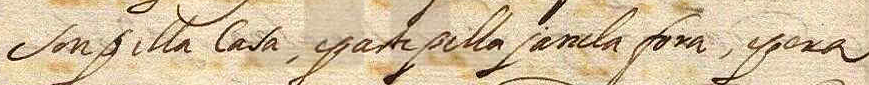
sou pella casa, e parte pella janela fora, e pera
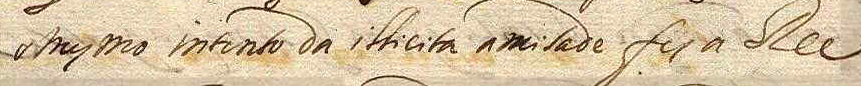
o mesmo intento da illicita amisade fes a Ree
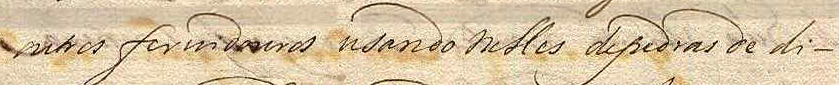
outros feruidouros usando nelles de pedras de di
